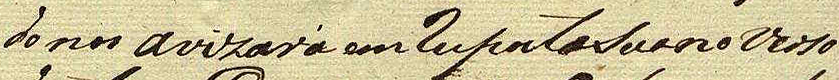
do nos avizará em Resposta Sua no verso
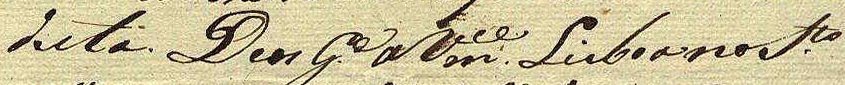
desta. Deos G.e a Vm.ce Lisboa no S.to
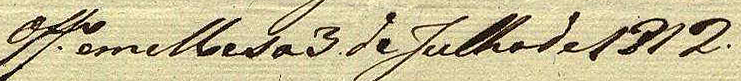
off.o em Meza 3 de Julho de 1812.
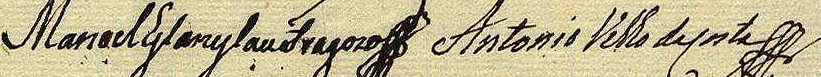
Manoel Estanislau Fragozo Antonio Velho da Costa
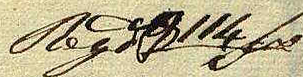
Regda f 114v
